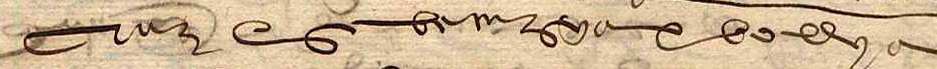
Cruz e se bemzya e bollya
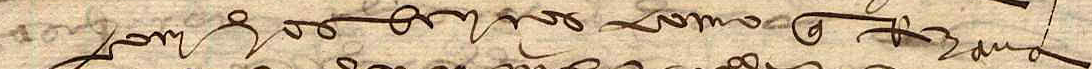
com hos beyços como q̄ Rezaua
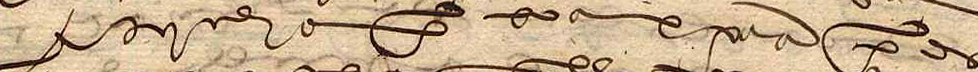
a tynha p̄o boa xpaā p̄o os
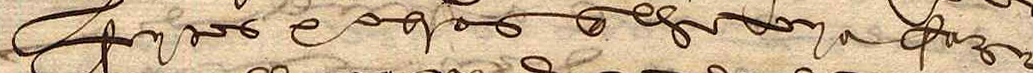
feytos e obras q̄ lhe vya fazer
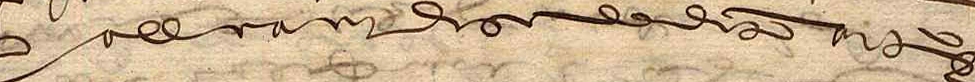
e all nam dise do dito arto
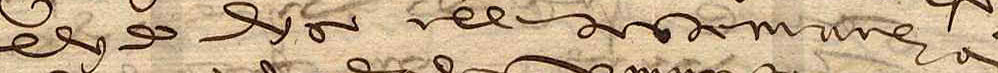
llydo dyse elle testemunha
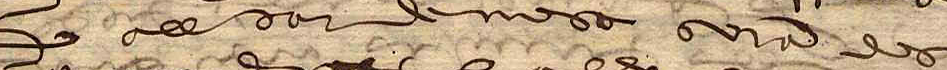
do alltar de nosa sorā dos
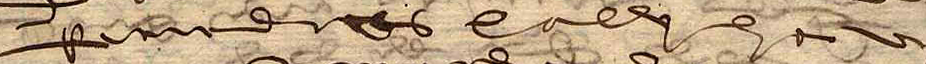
Remedios e ally ha vya
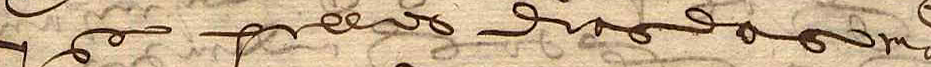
ysto pellos dias da soma
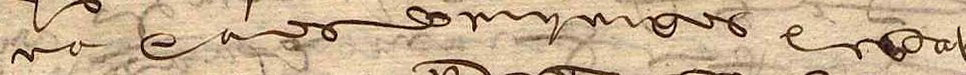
na e aos domymgos e estava
